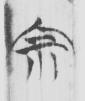宗
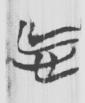忘
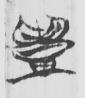豊
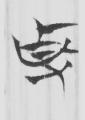史
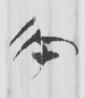帀
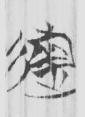{止達}
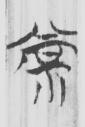常
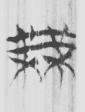無
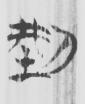型
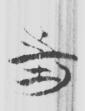市
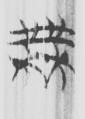無
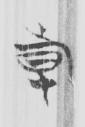倝
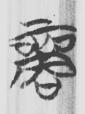商
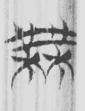無
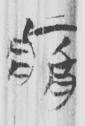{疒兔}
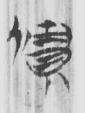價
